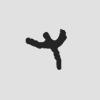又
